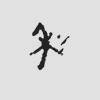利
